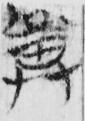畢
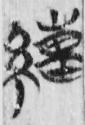○（紳）
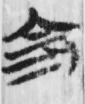命
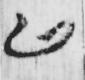㠯（以）
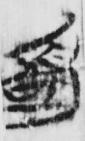○（夏）
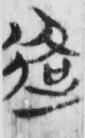○（路）
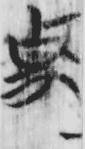史
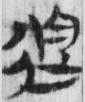逾
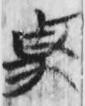史
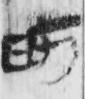爲
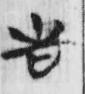告
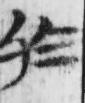於
